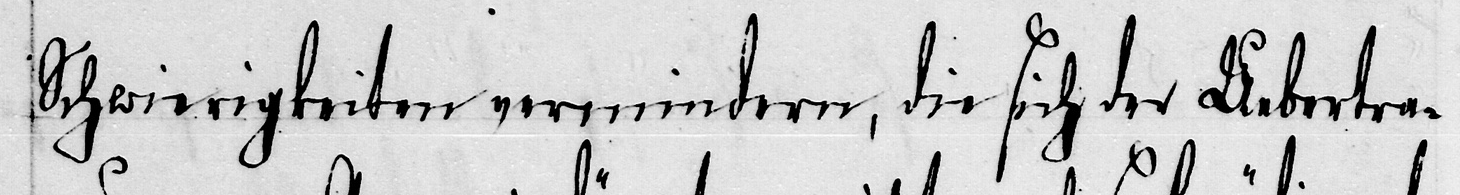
Schwierigkeiten vermindern, die sich der Uebertra¬
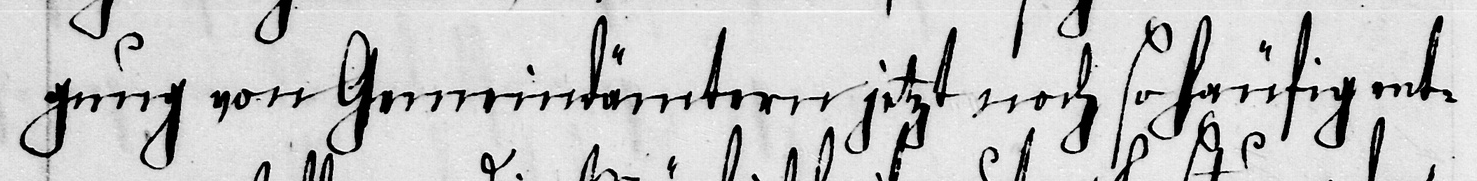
gung von Gemeindämtern jetzt noch so häufig ent¬
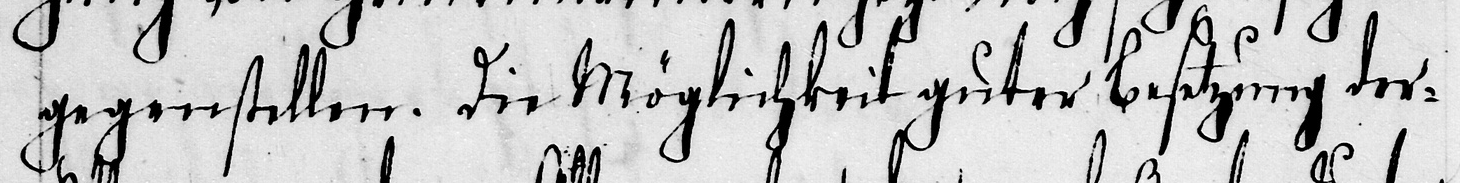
gegenstellen. Die Möglichkeit guter Besetzung de¬
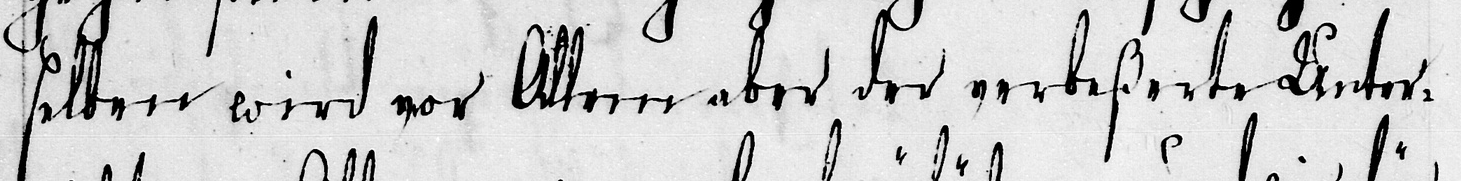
selben wird vor Allem aber der verbeßerte Unter¬
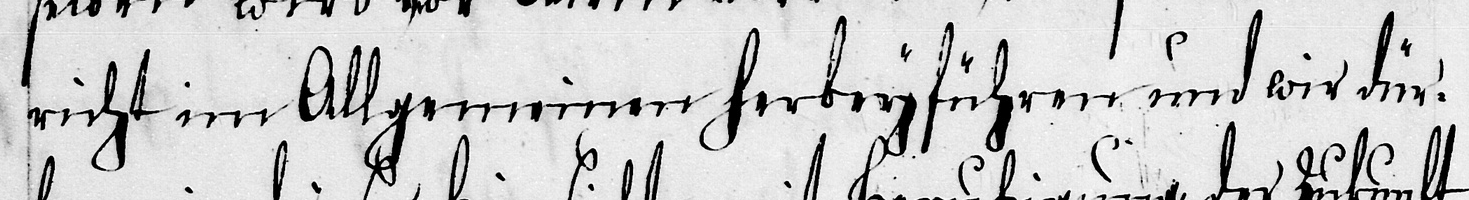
richt im Allgemeinen herbeyführen und wir dür¬
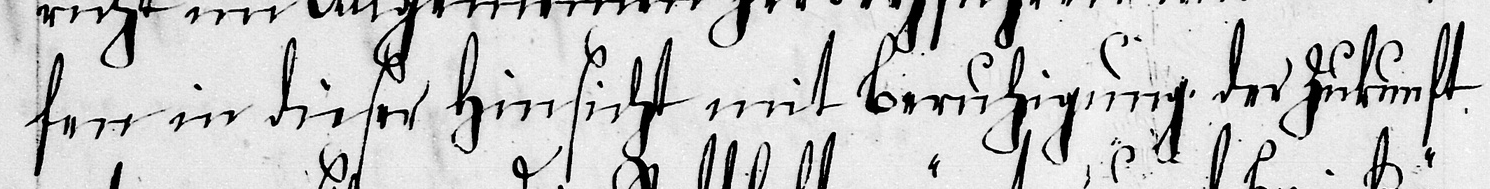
fen in dieser Hinsicht mit Beruhigung der Zukunft
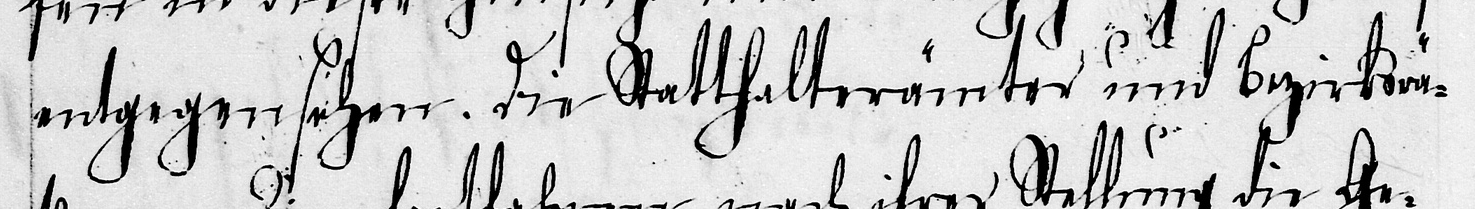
entgegensehen. Die Statthalterämter und Bezirksrä¬
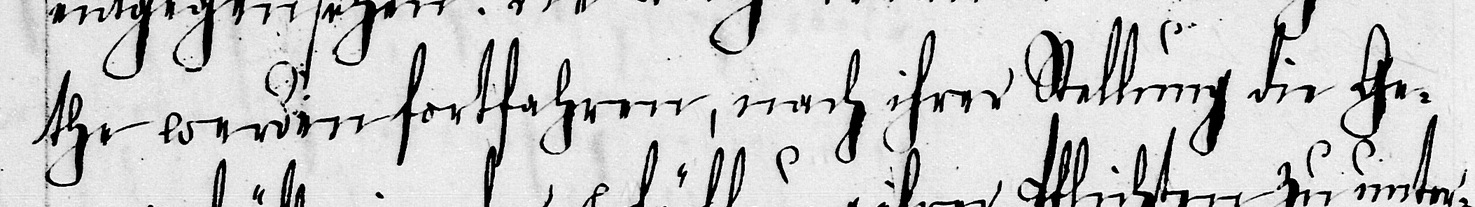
the werden fortfahren, nach ihrer Stellung die Ge¬
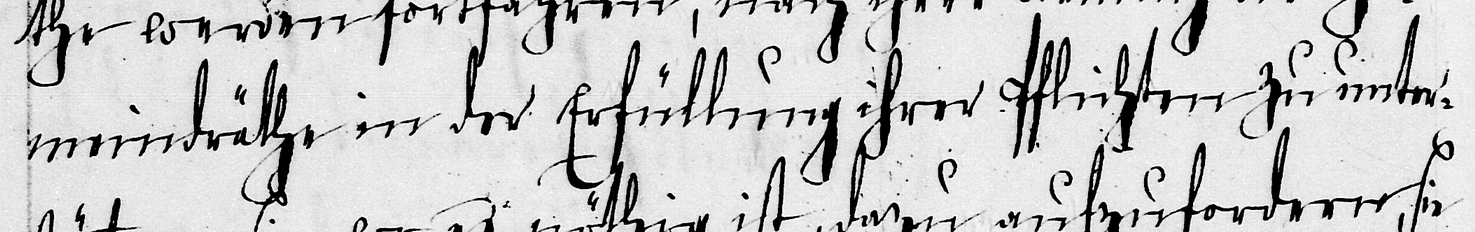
meindräthe in der Erfüllung ihrer Pflichten zu unter¬
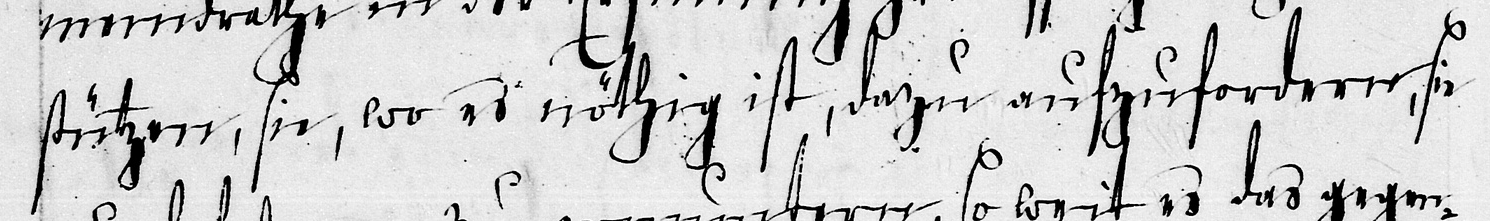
stützen, sie, wo es nöthig ist, dazu aufzufordern, sie
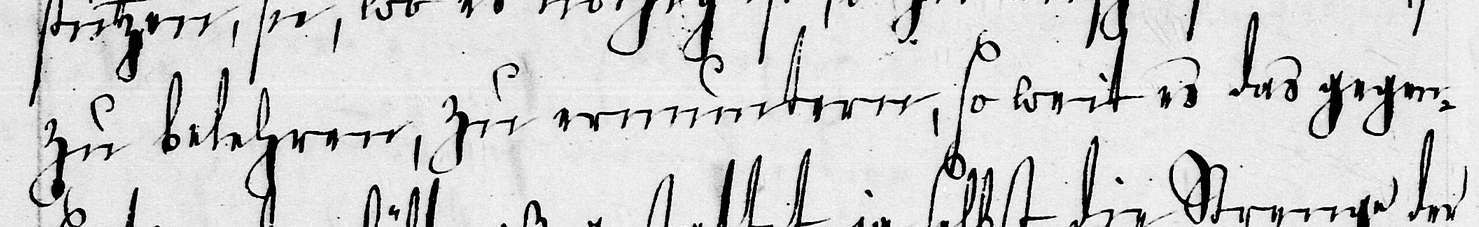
zu belehren, zu ermuntern, so weit es das gegen¬
